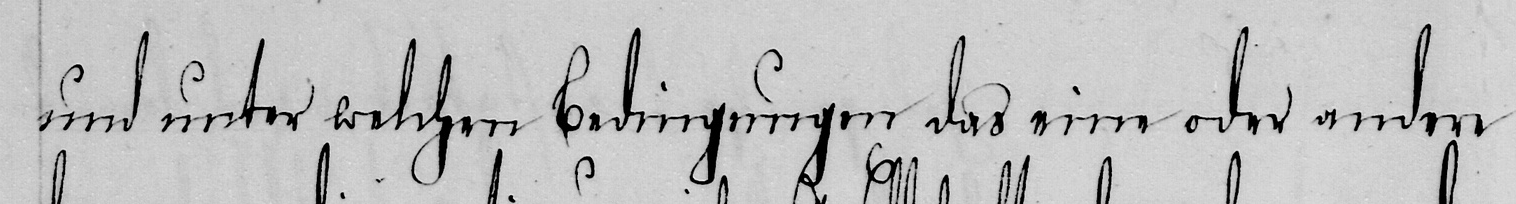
und unter welchen Bedingungen das eine oder andere
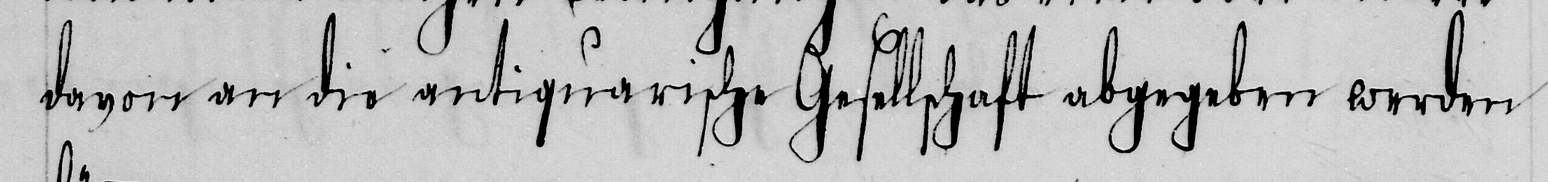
davon an die antiquarische Gesellschaft abgegeben werden
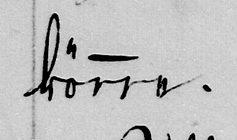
könne.
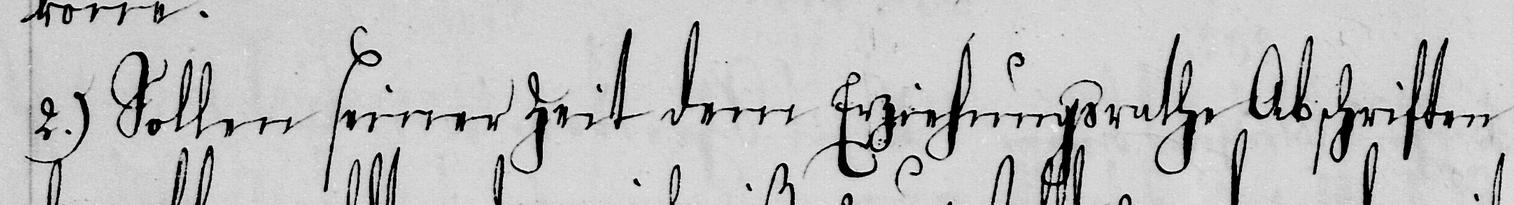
2.) Sollen seiner Zeit dem Erziehungsrathe Abschriften
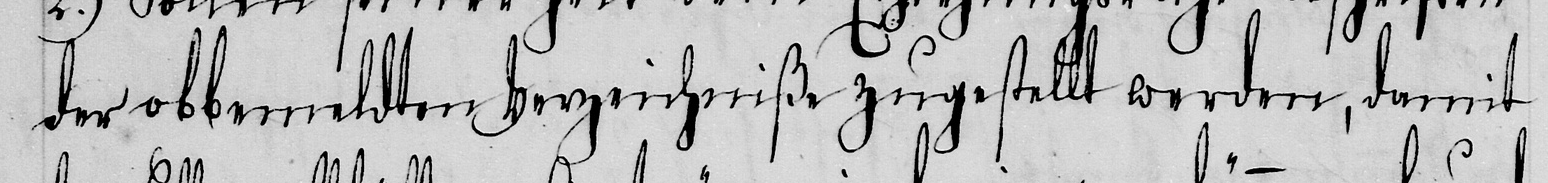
der obbemeldten Verzeichniße zugestellt werden, damit
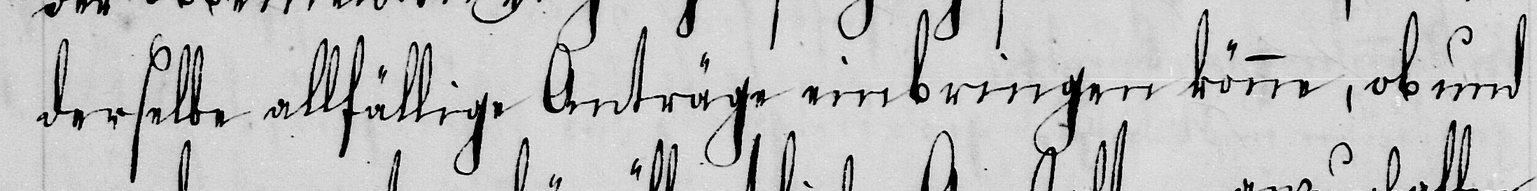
derselbe allfällige Anträge einbringen könne, ob und
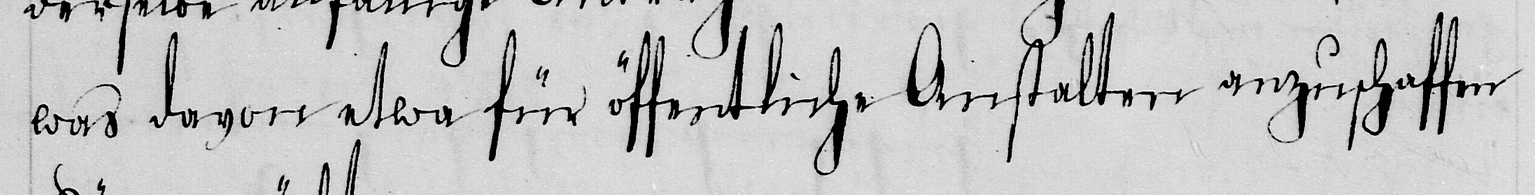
was davon etwa für öffentliche Anstalten anzuschaffen
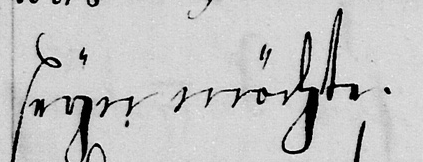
seyn möchte.
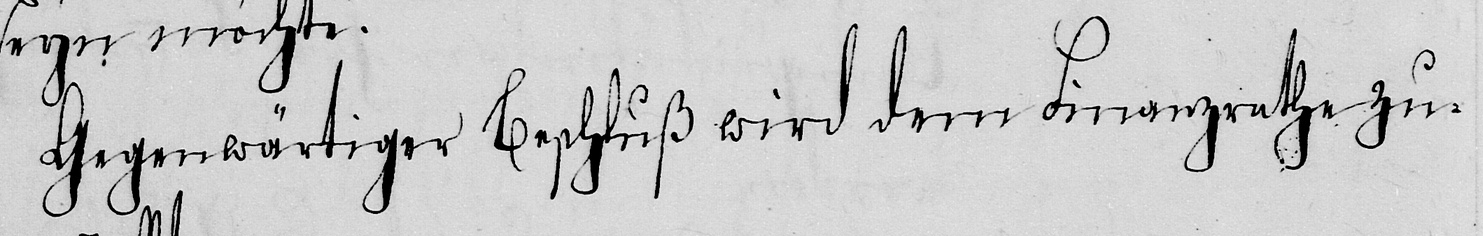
Gegenwärtiger Beschluß wird dem Finanzrathe zu¬
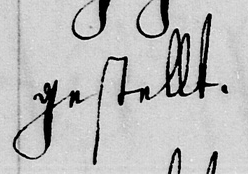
gestellt.
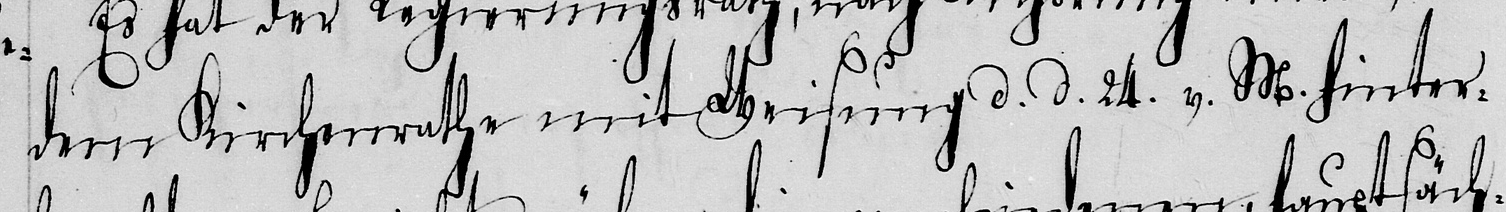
dem Kirchenrathe mit Weisung d. d. 24. v. M. hinter¬
